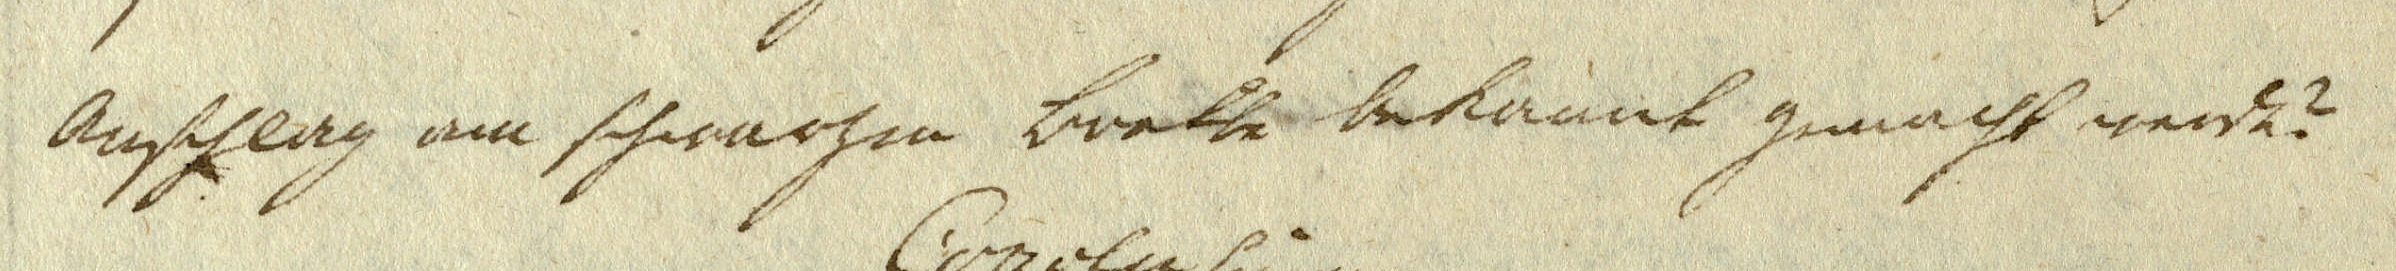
Anschlag am schwarzen Brette bekannt gemacht werde?
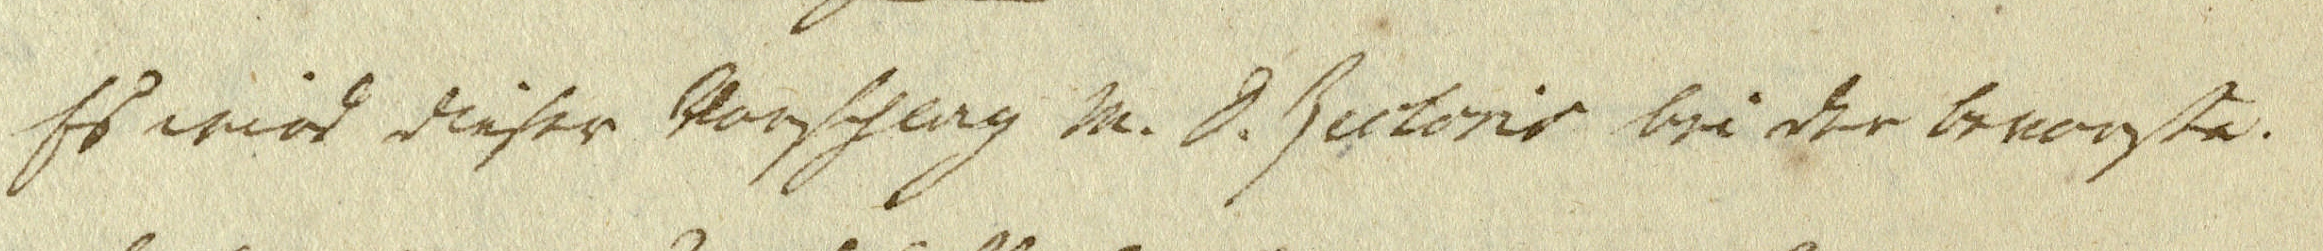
Es wird dieser Vorschlag M. D. Rectoris bei der bevorste¬
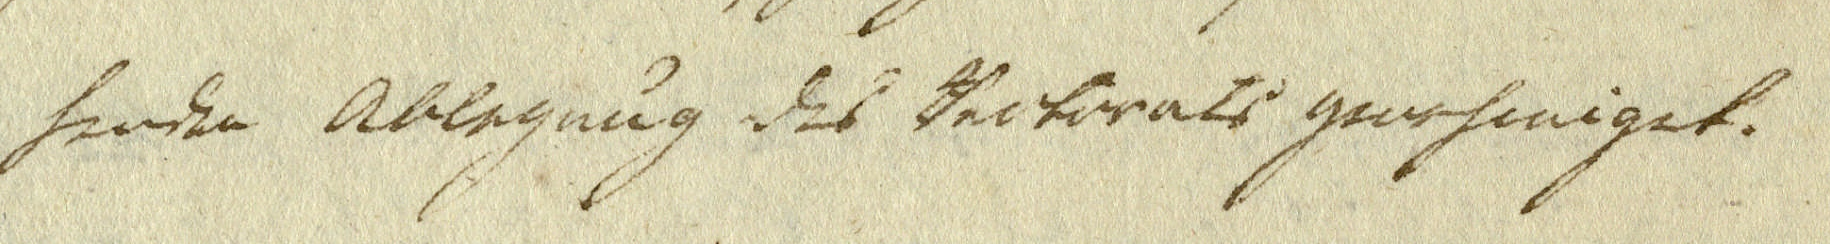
henden Ablegung des Rectorats genehmiget.
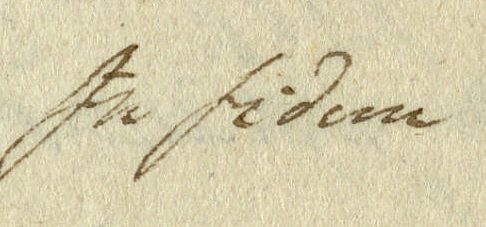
In fidem
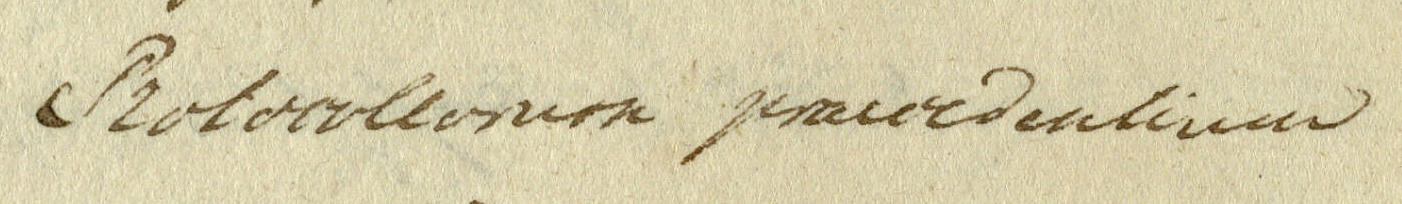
Protocollorum praecedentium
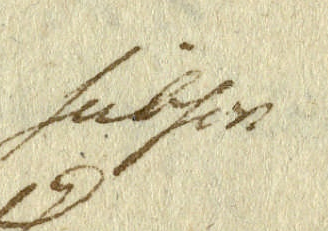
subscr.
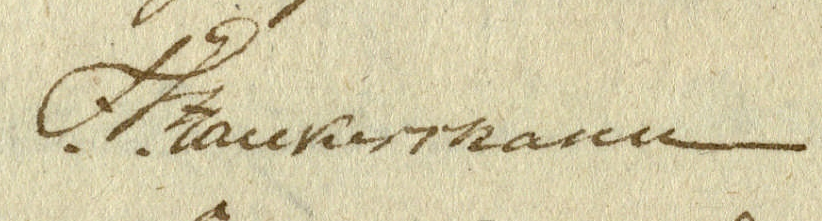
J.G.Haeckermann
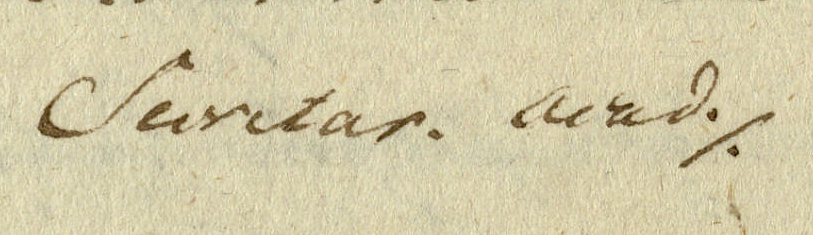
Secetar. acad.
